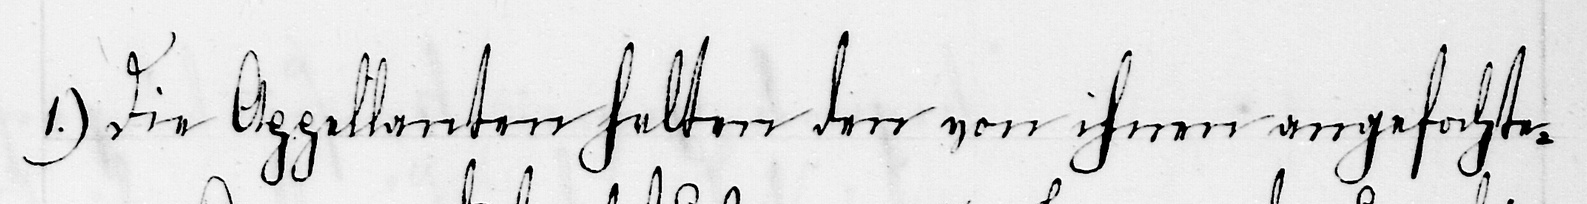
1.) Die Appellanten halten den von ihnen angefochte¬
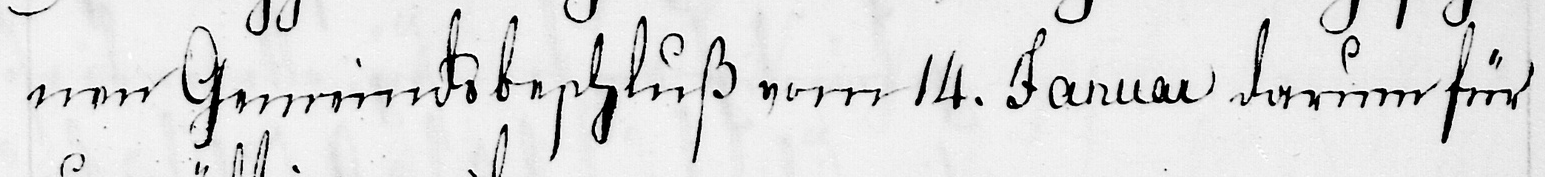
nen Gemeindsbeschluß vom 14. Januar darum für
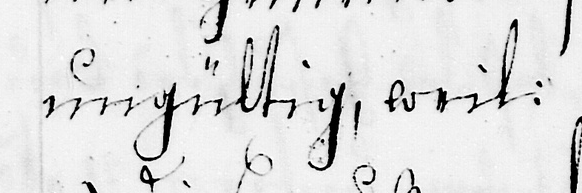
ungültig, weil:
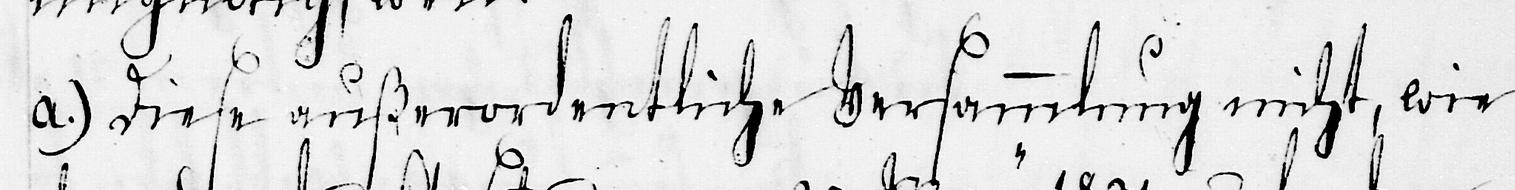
a.) Diese außerordentliche Versammlung nicht, wie
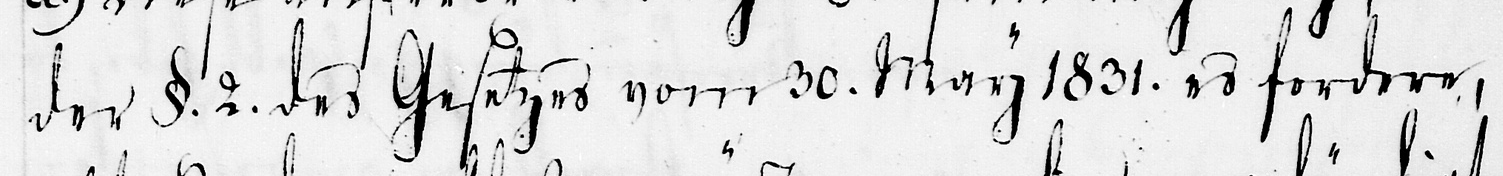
der §. 2. des Gesetzes vom 30. März 1831. es fordere,
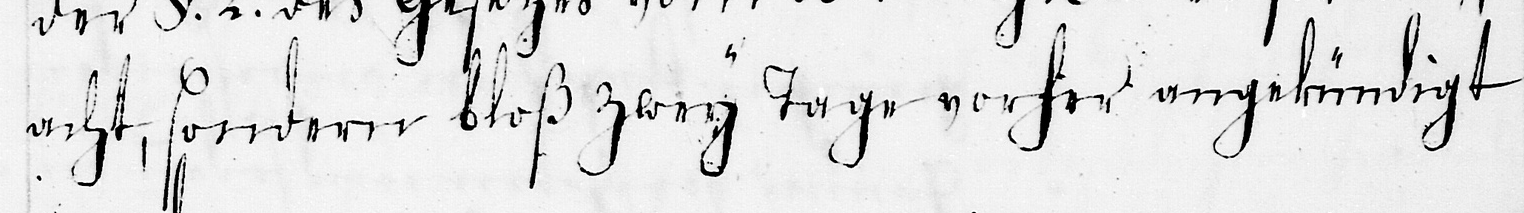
acht, sondern bloß zwey Tage vorher angekündigt
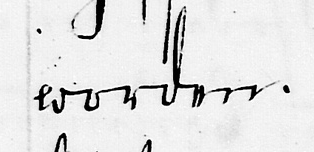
worden.
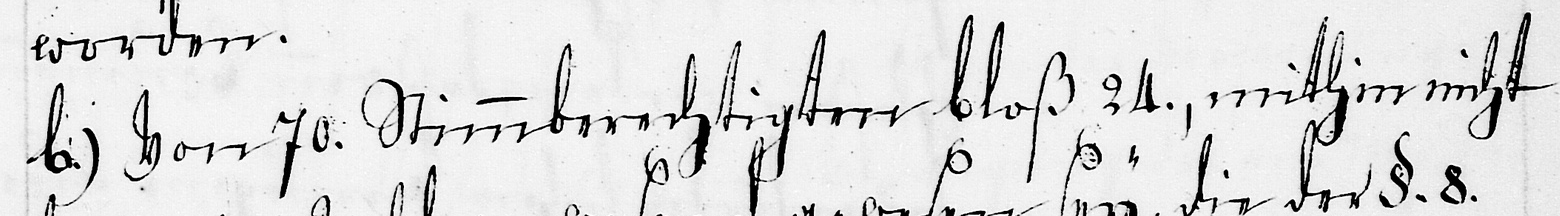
b.) Von 70. Stimmberechtigten bloß 24., mithin nicht
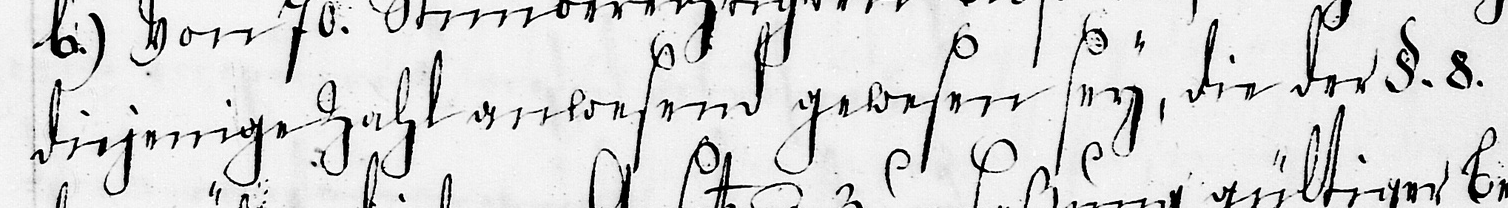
diejenige Zahl anwesend gewesen sey, die der §. 8.
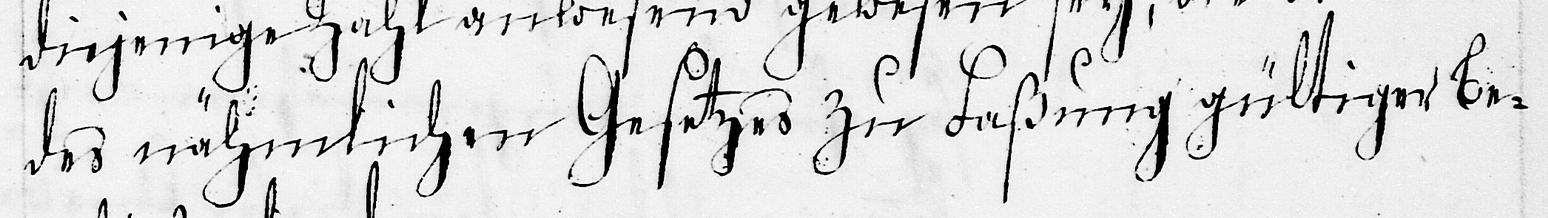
des nähmlichen Gesetzes zu Faßung gültiger Be¬
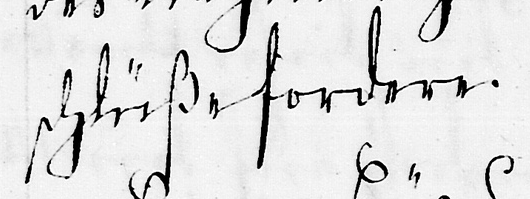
schlüße fordere.
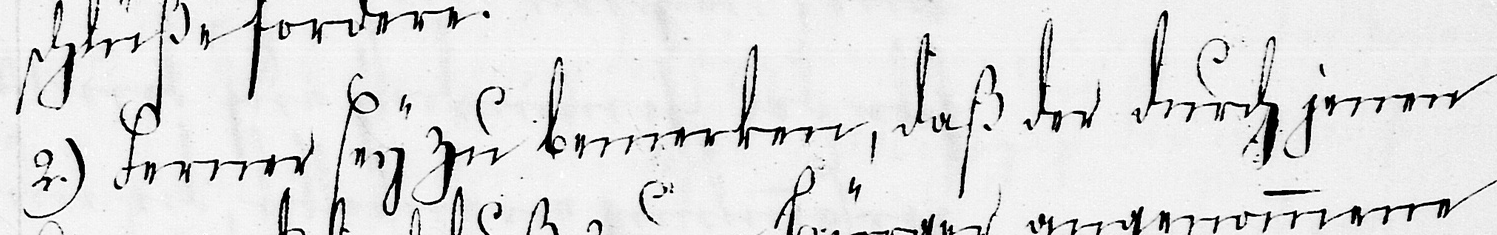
2.) Ferner sey zu bemerken, daß der durch jenen
